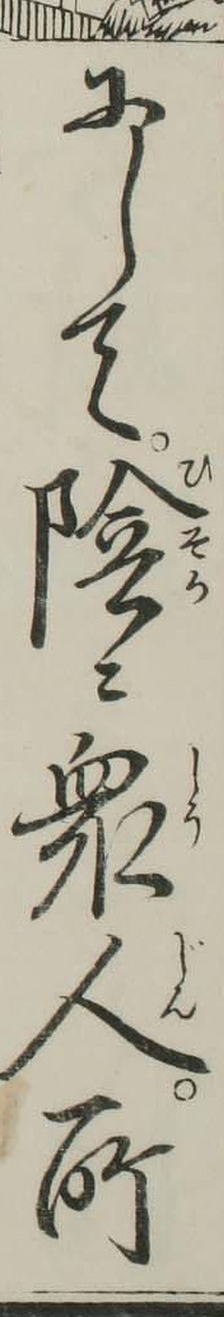にして。陰に衆人。所

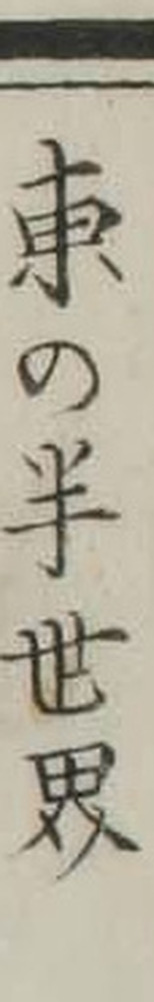東の半世界
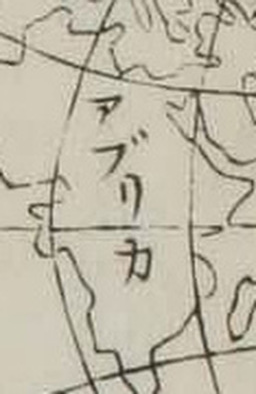アブリカ
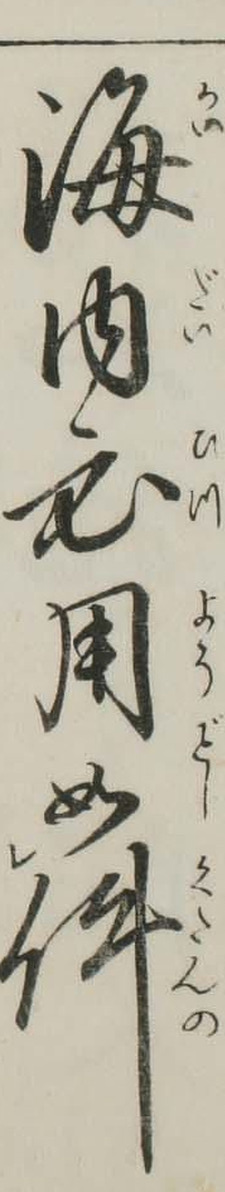海内必用如件
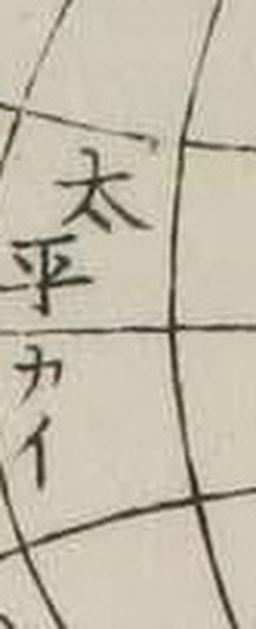太平カイ
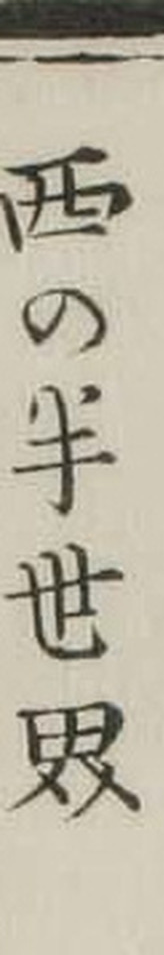西の半世界
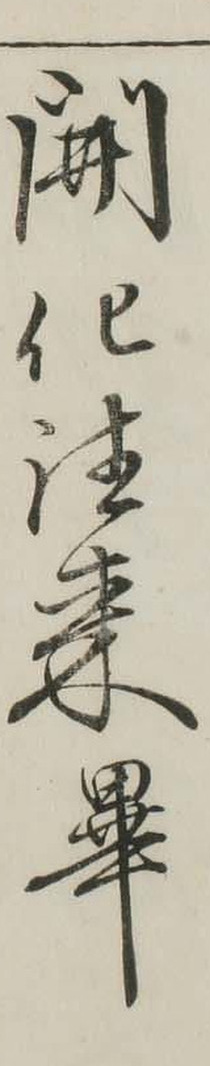開化往来畢
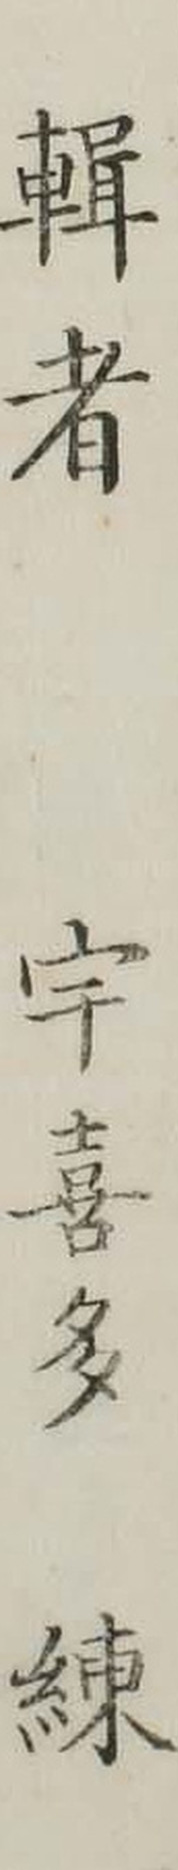輯者宇喜多練
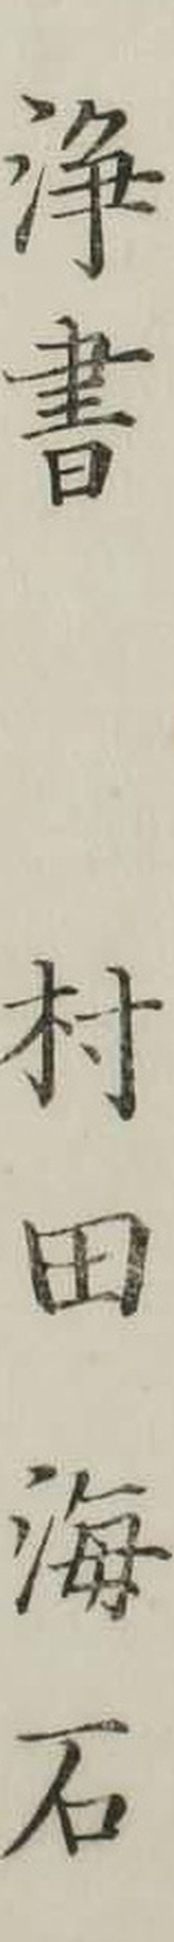浄書村田海石
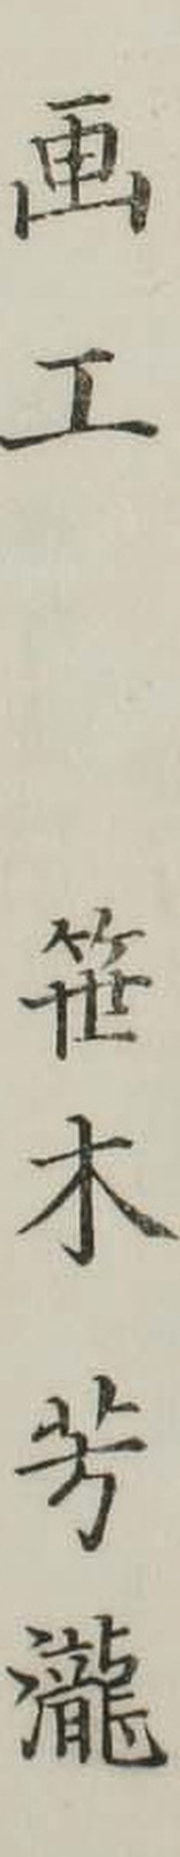画工笹木芳瀧
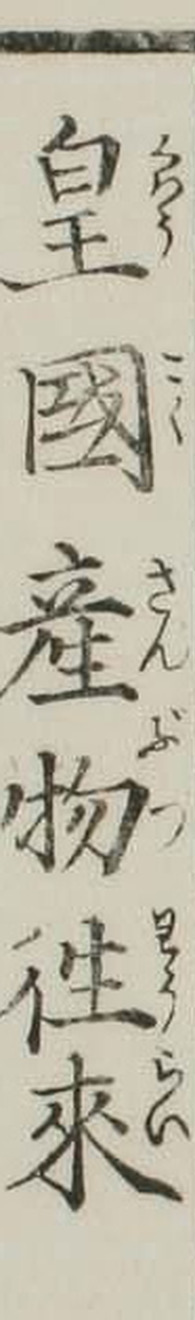皇国産物往来
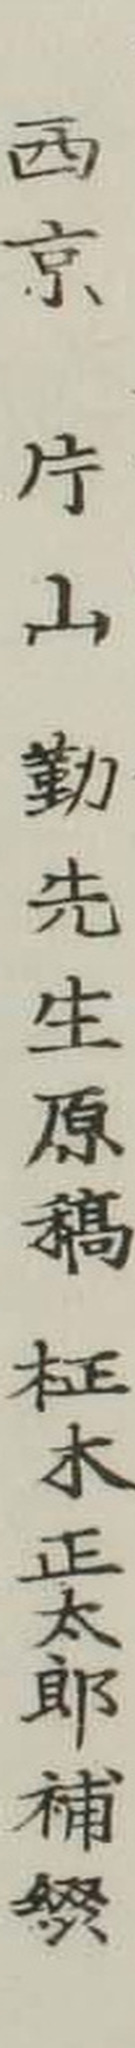西京片山勤先生原稿柾木正太郎補綴
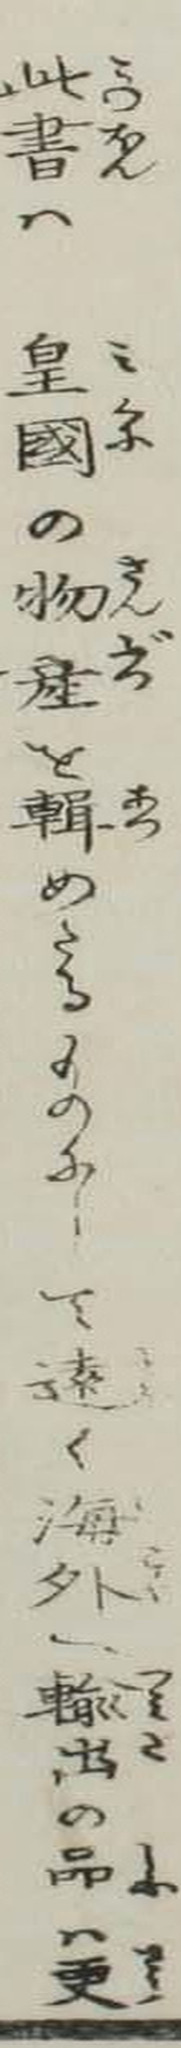此書は皇国の物産を輯めたるものにして遠く海外へ輸出の品は更
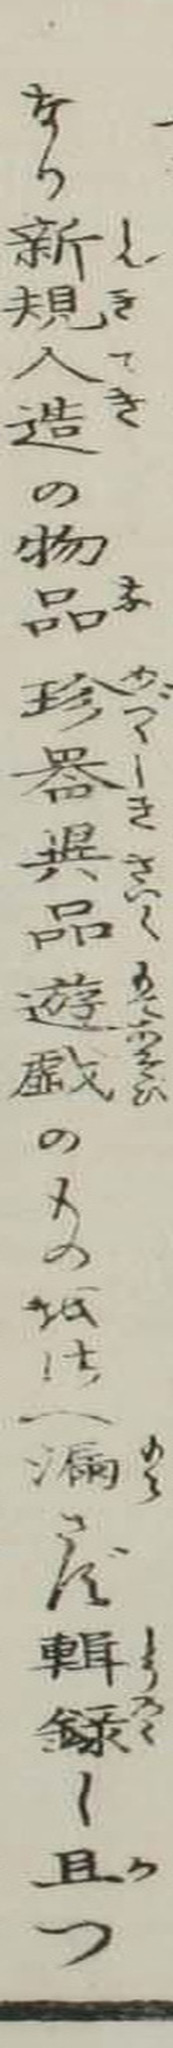なり新規人造の物品珍器異品遊戯のものをさへ漏さず輯録し且つ
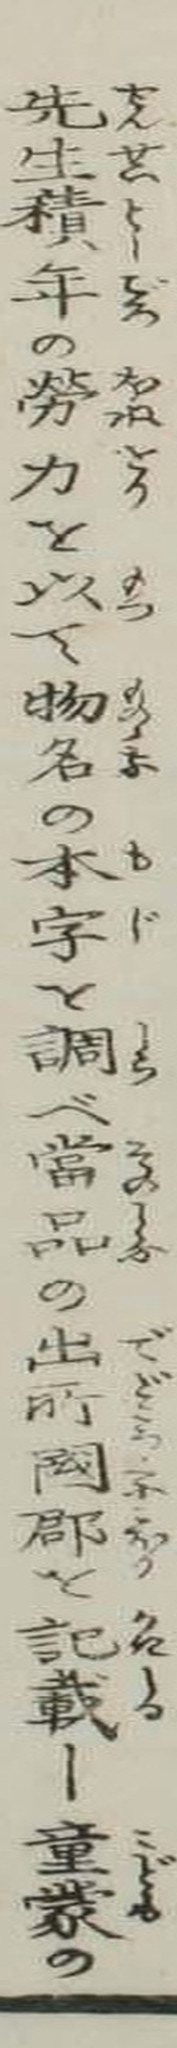先生積年の労力を以て物名の本字を調べ当品の出所国郡を記載し童蒙の
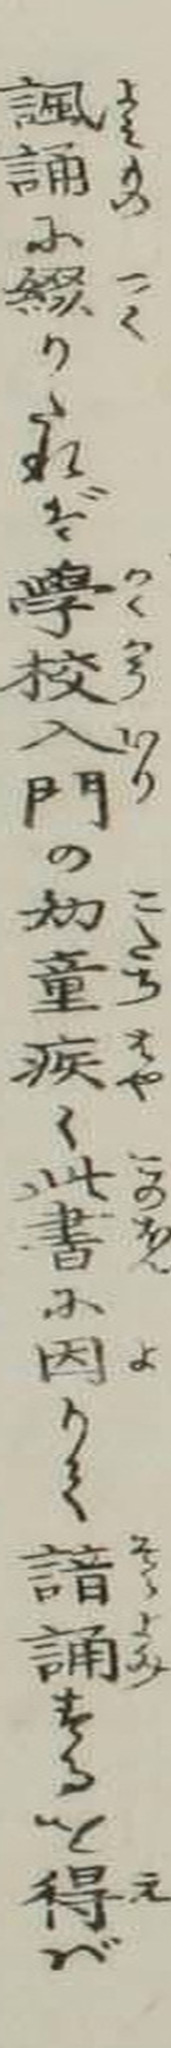諷誦に綴りたれば学校入門の幼童疾く此書に因りて諳誦するを得ば
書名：開化往来
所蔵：東京学芸大学教育コンテンツアーカイブ
